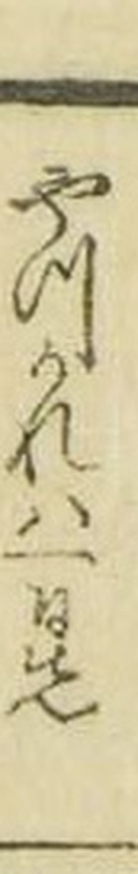やつかれは一日先
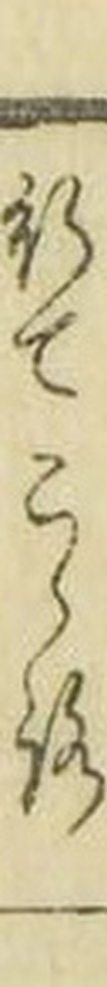行てこゝろ
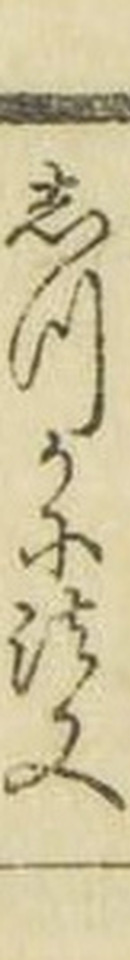しつかに法文
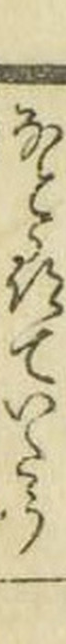なと尋ていたう
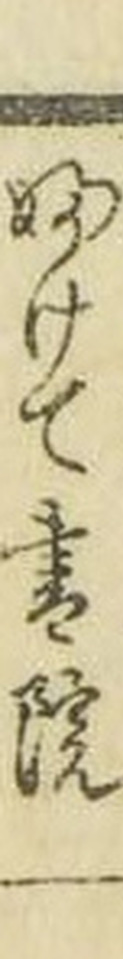ふけて書院
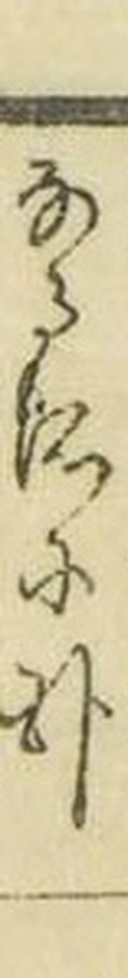なる所に臥
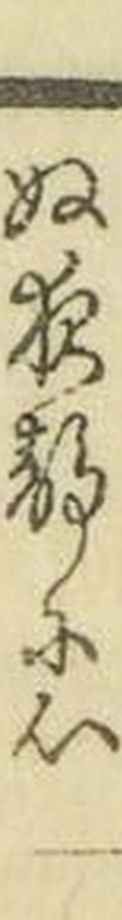ぬ夜静に心
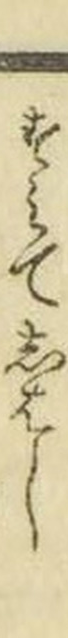すみてしはし
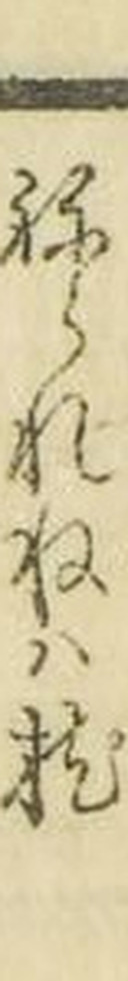ねられねは枕
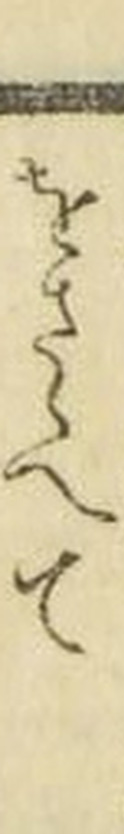をさゝへて
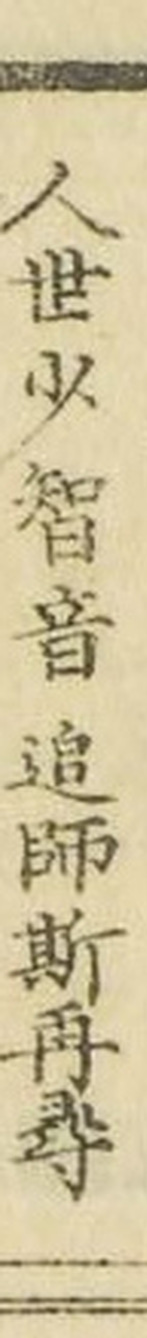人世少智音追師斯再尋
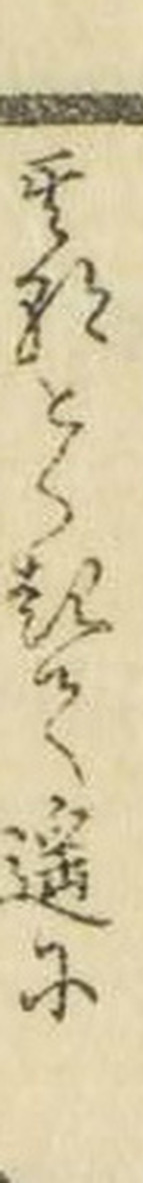其朝とく起て遥に
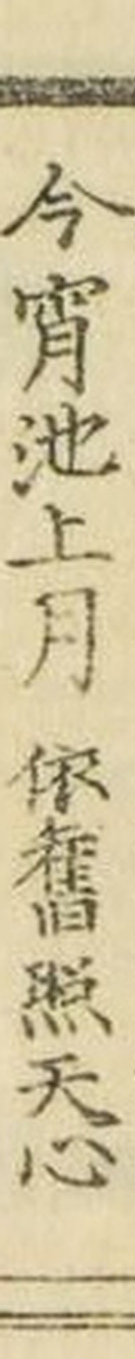今宵池上月依𦾔照天心
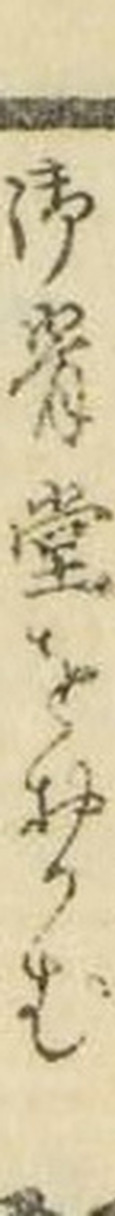御骨堂をおかむ
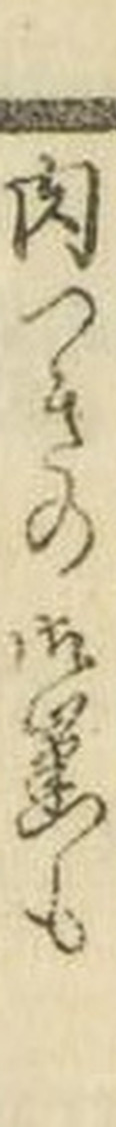肉つきの御墨も
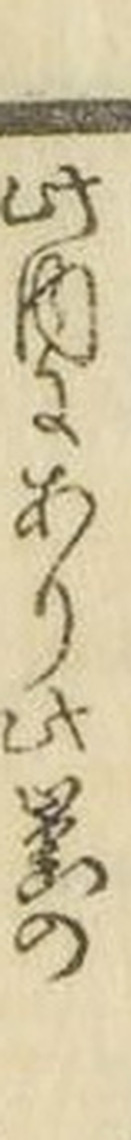此内にあり此墨の
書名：江戸名所図会 20巻 巻之4
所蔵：東京学芸大学教育コンテンツアーカイブ
